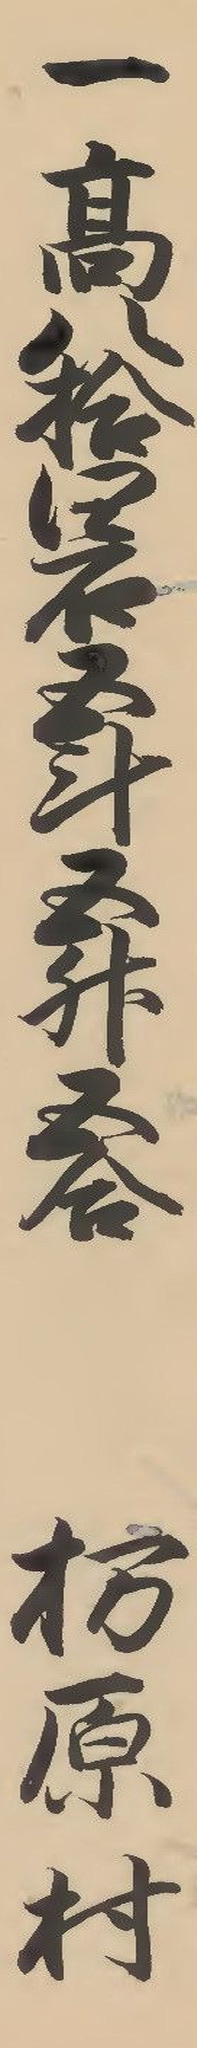一髙八拾四石五斗五升五合杤原村
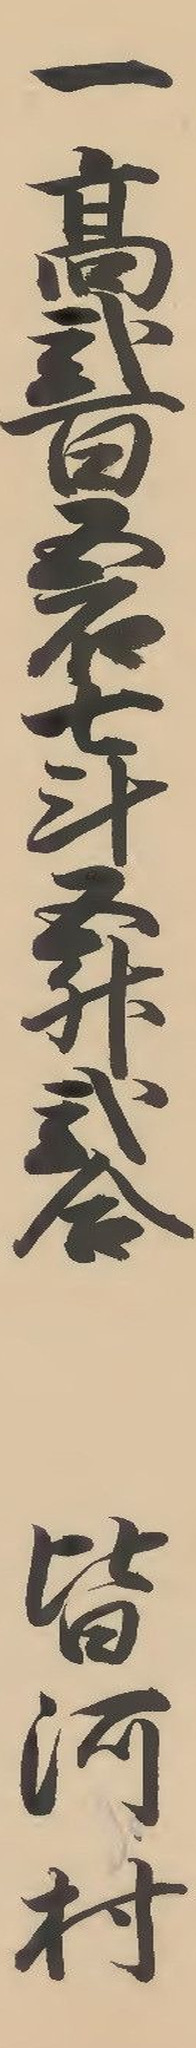一髙弐百五石七斗五升弐合皆河村
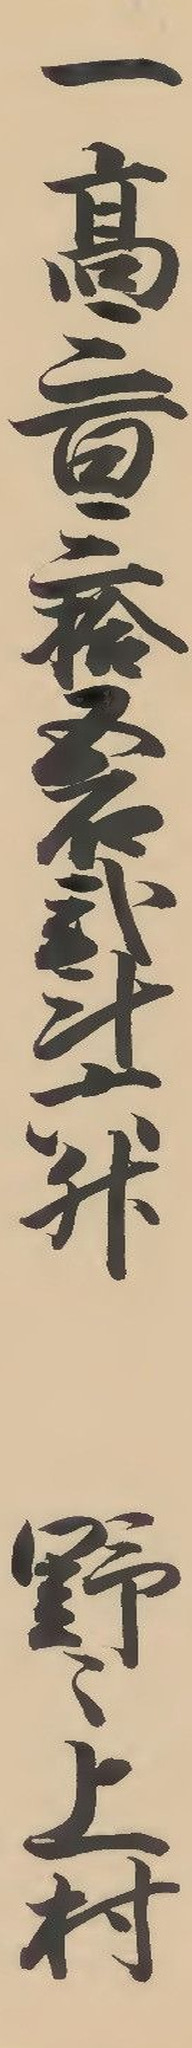一髙三百三拾五石弐斗六升野々上村
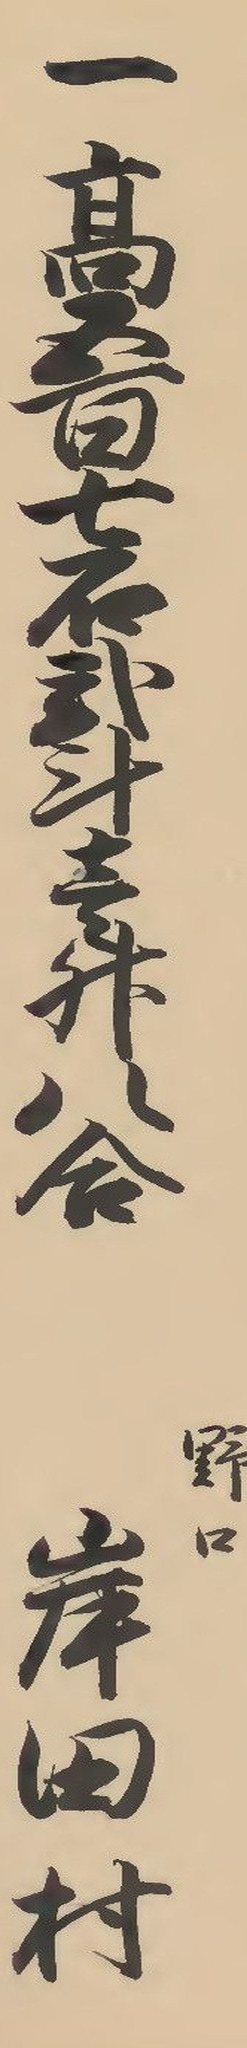一髙五百七石弐斗壱升八合岸田村
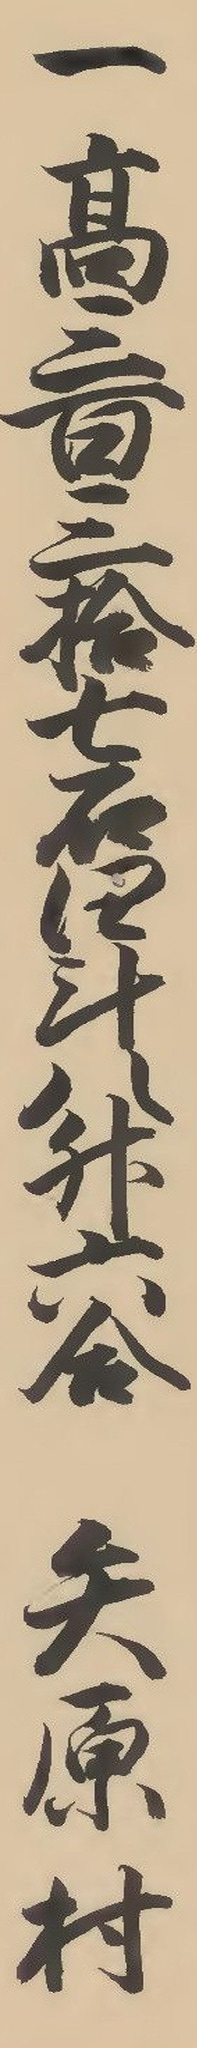一髙三百三拾七石四斗八升六合矢原村
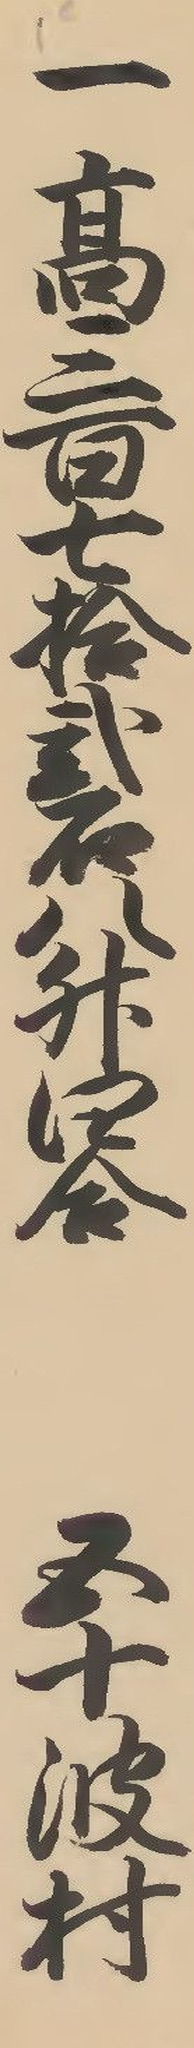一髙三百七拾弐石八升四合五十波村
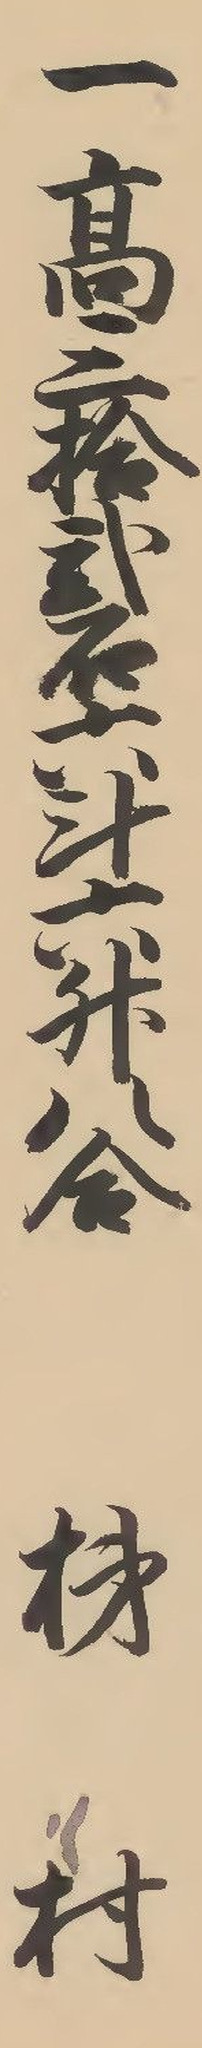一髙三拾弐石六斗六升八合村
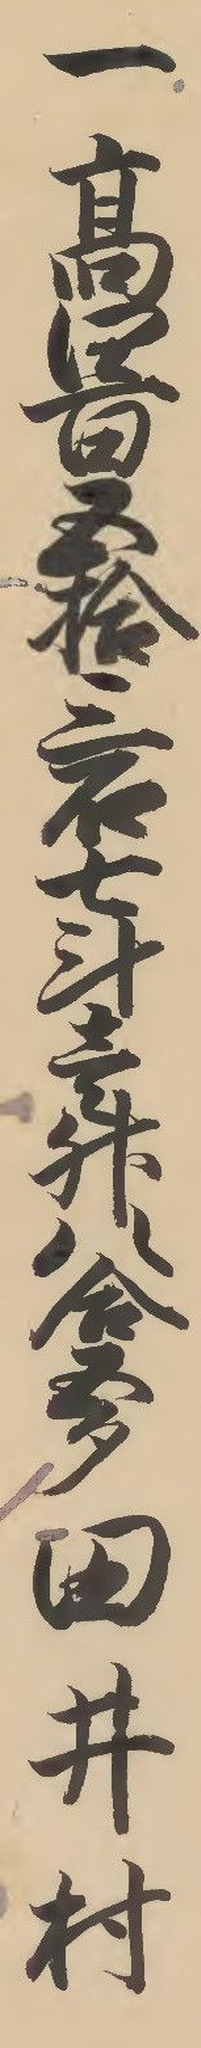一髙四百五拾三石七斗壱升八合五夕田井村

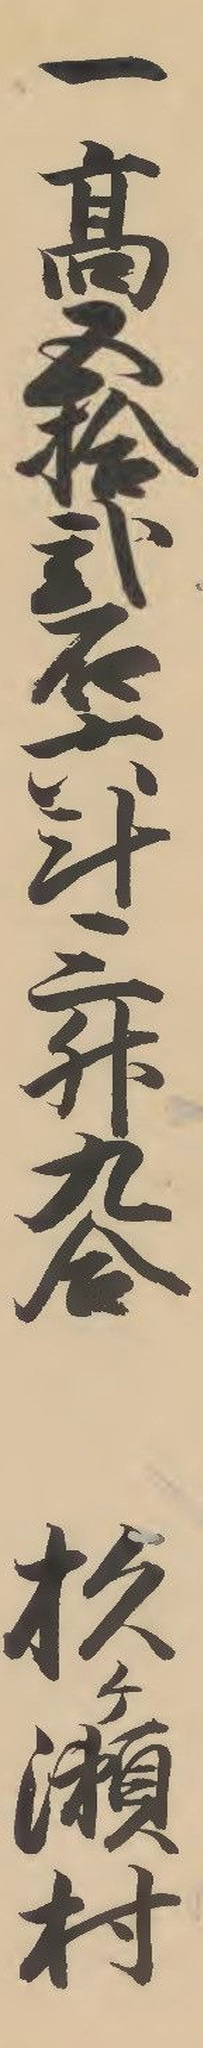一髙五拾弐石六斗三升九合杦ケ瀬村
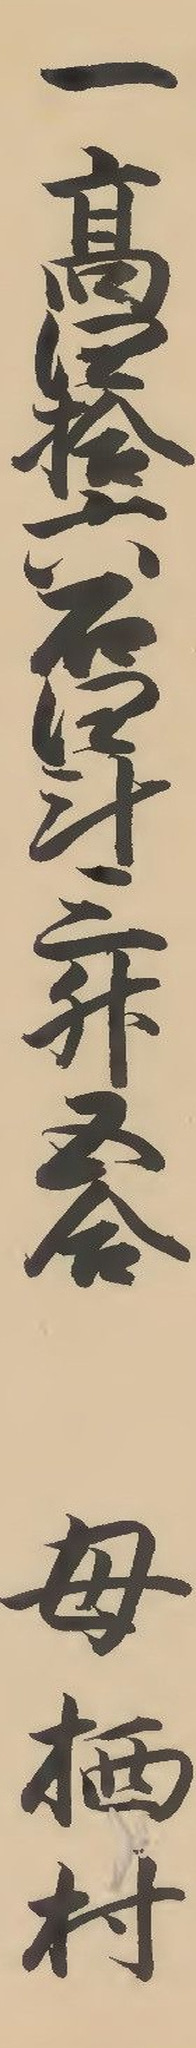一髙四拾六石四斗三升五合母栖村
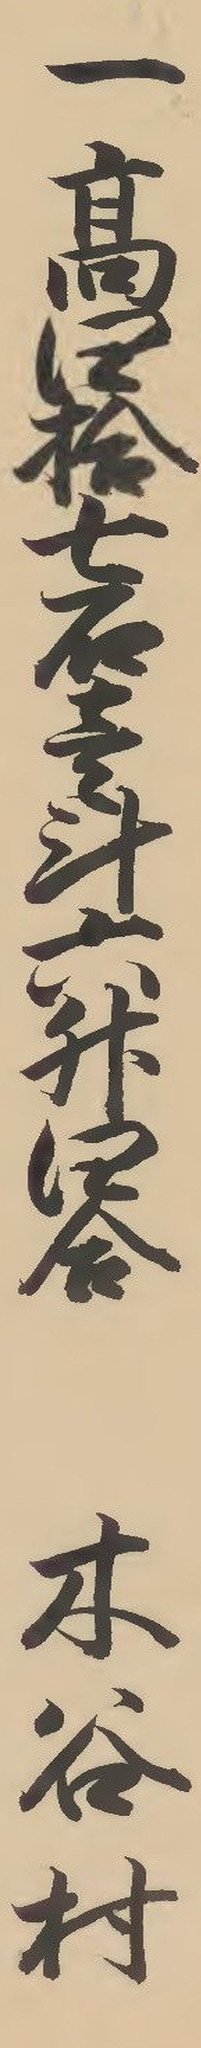一髙四拾七石壱斗六升四合木谷村
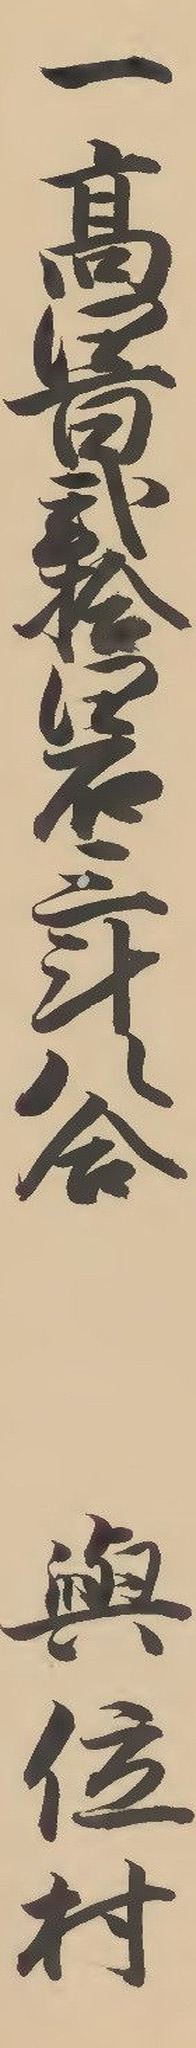一髙四百弐拾四石三斗八合與位村
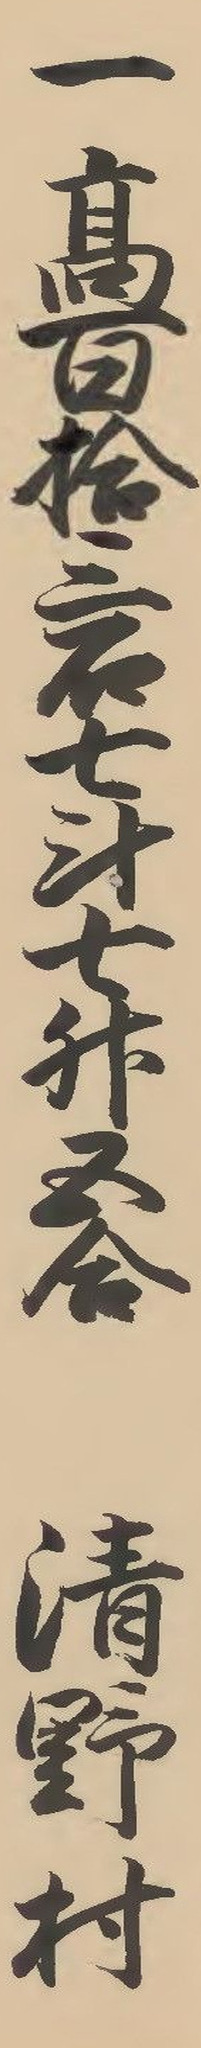一髙百拾三石七斗七升五合清野村
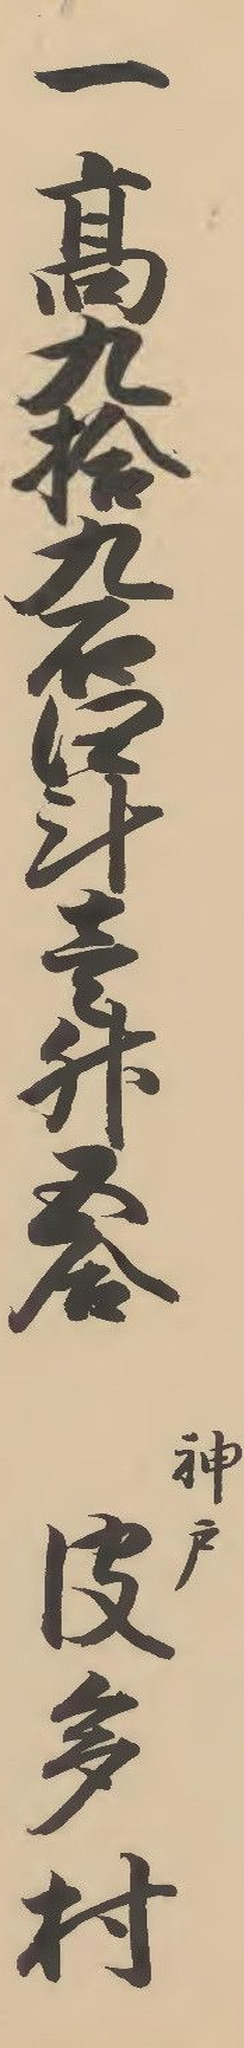一髙九拾九石四斗壱升五合皮多村
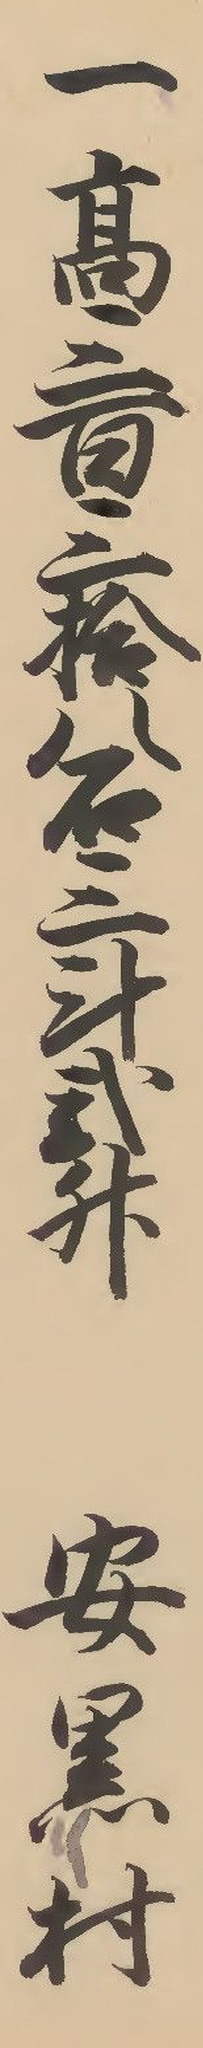一髙三百三拾八石三斗弐升安黑村
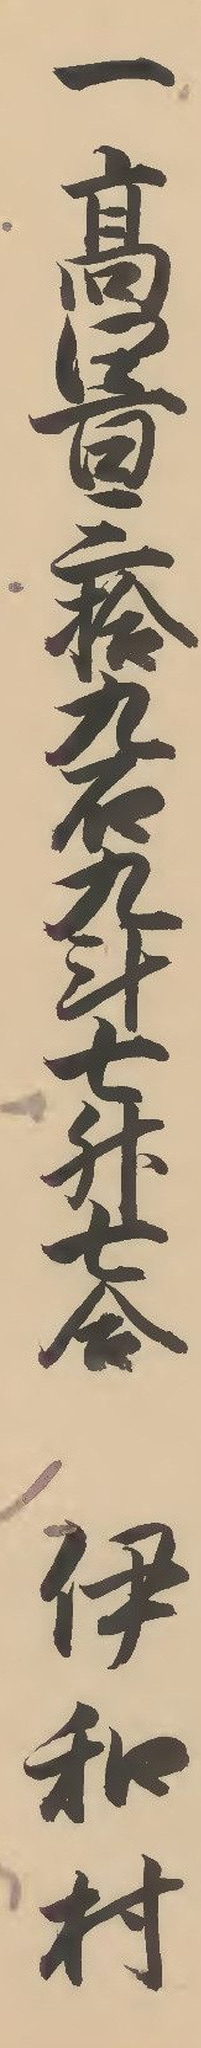一髙四百三拾九石九斗七升七合伊和村
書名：播磨国郷帳
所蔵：国立公文書館 National Archives of Japan
